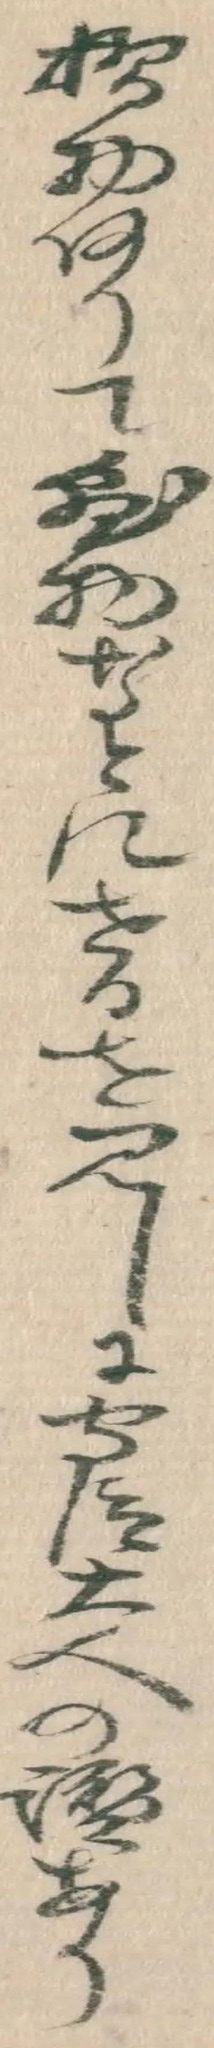摺物ありて懸物なとにせるを見しに守臣大人の讃あり
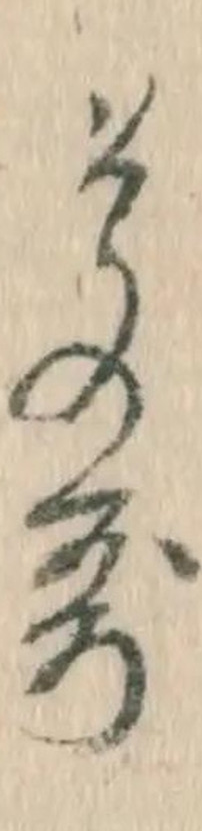その哥
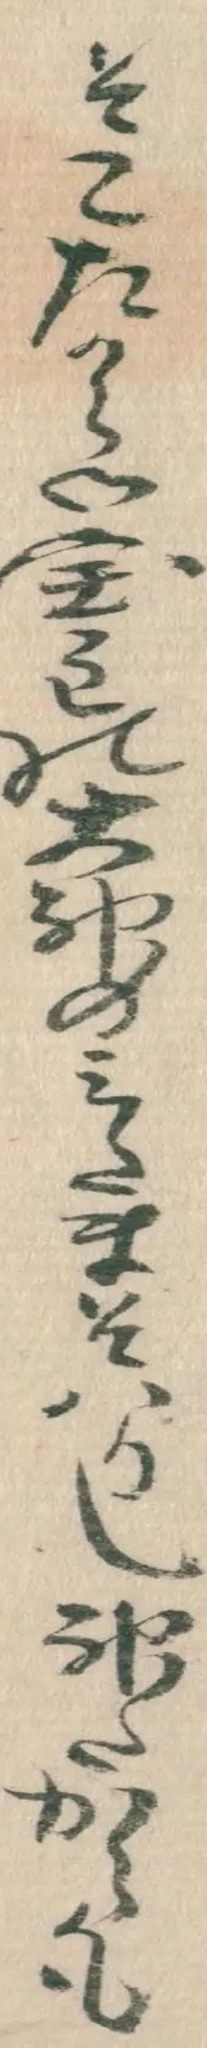そこたから御宝主の大神のみたまそはりし神たからかも
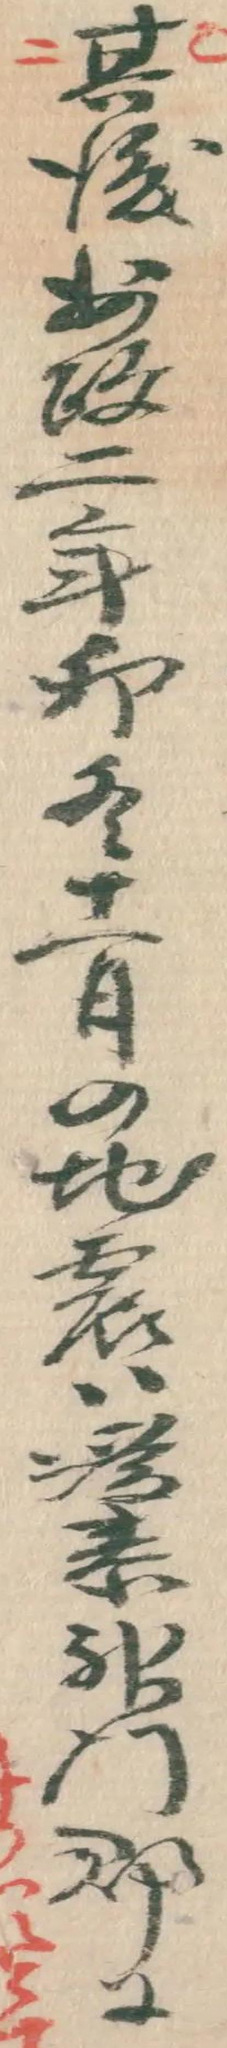「其」此後安政二年卯冬十一月の地震は為泰神門郡に

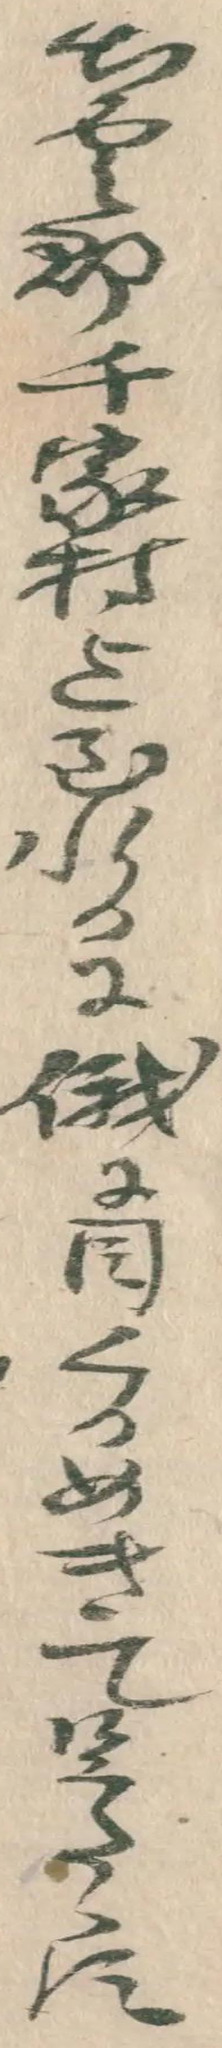出雲郡千家村迄至れるに俄に目くるめきて足たゝす
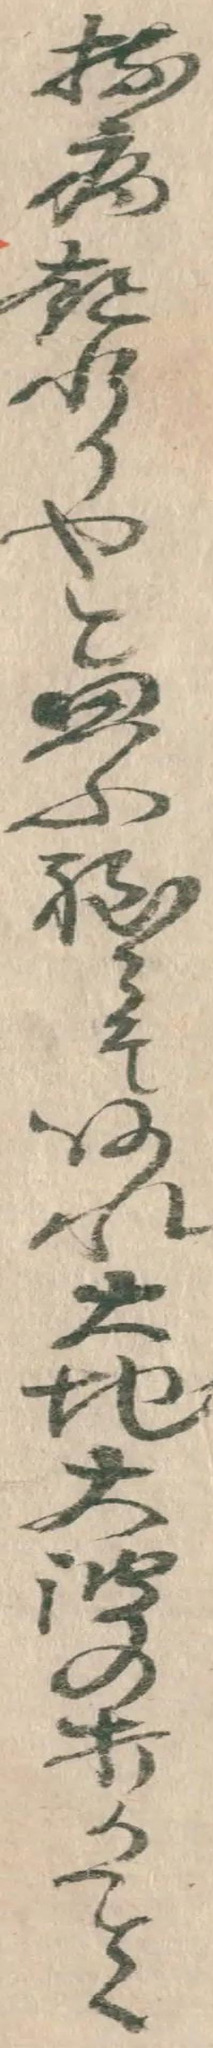持病起れりやと思ふ程にそあれ大地大波の打かことく
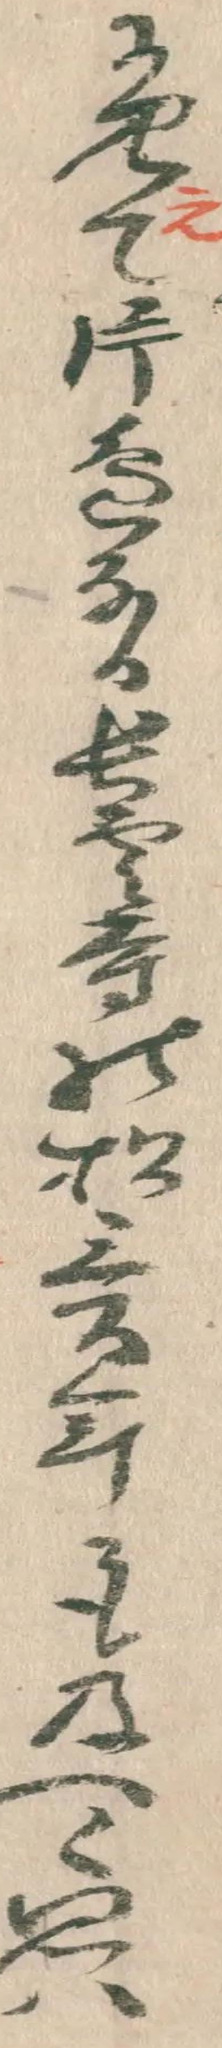に見えて片辺なる長雲寺の松三百年にも及へく思は
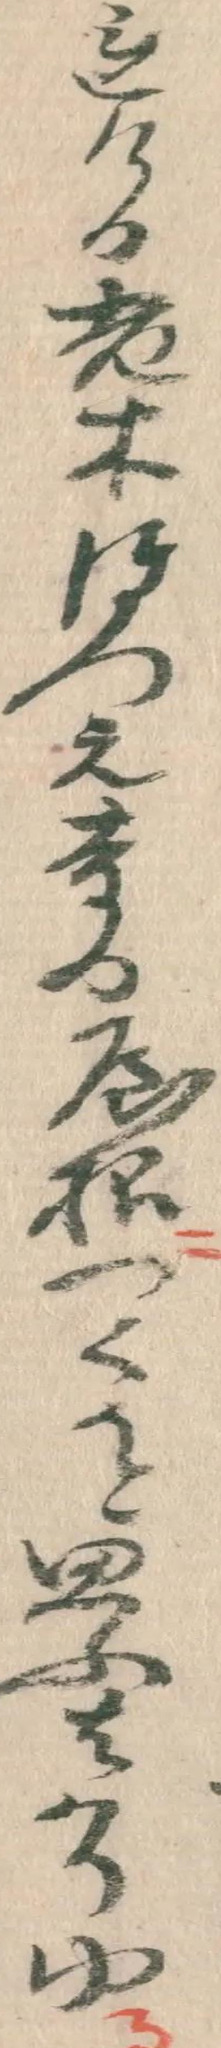れける老木ほつえ寺の屋根につくかと思ふはかりゆる
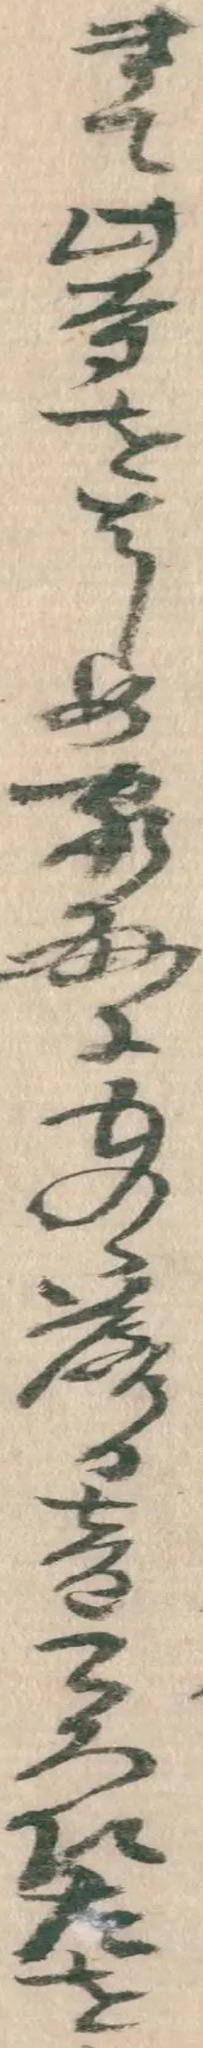まてこの寺をはしめ家毎にものゝ落る音ころひたを
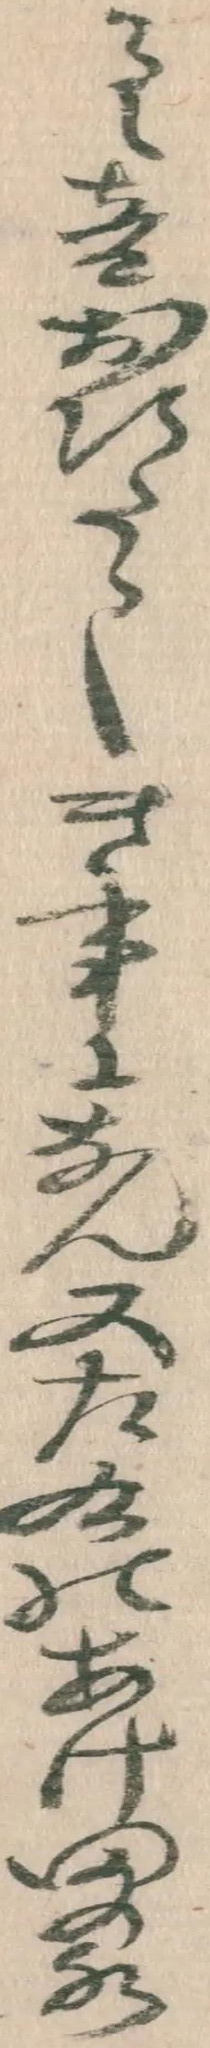るゝ音おひたゝしき事になん又左右のあけ田の水
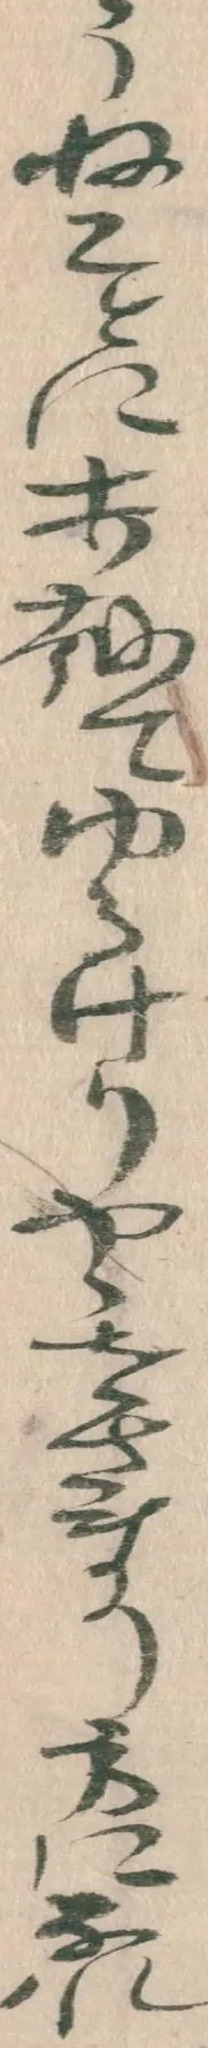うねことに打越てゆるけりやゝをさまり方になれ
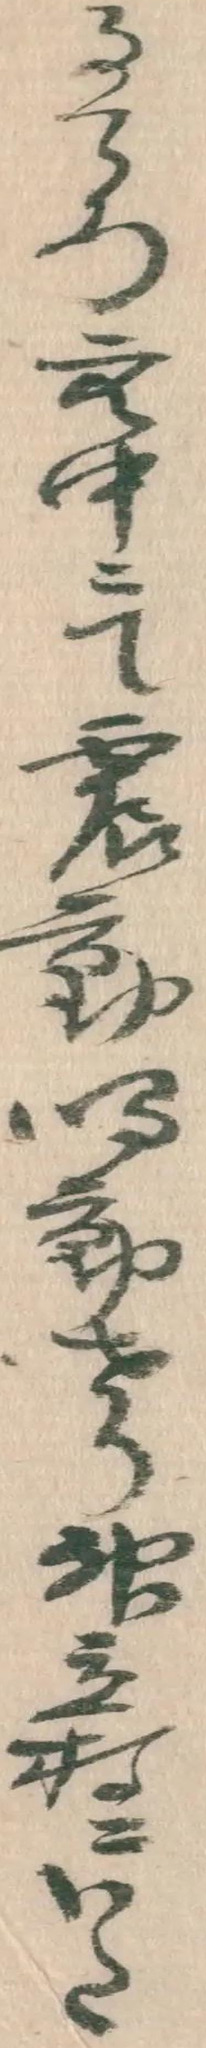るころ空中にて震動鳴動せり神立村にいた
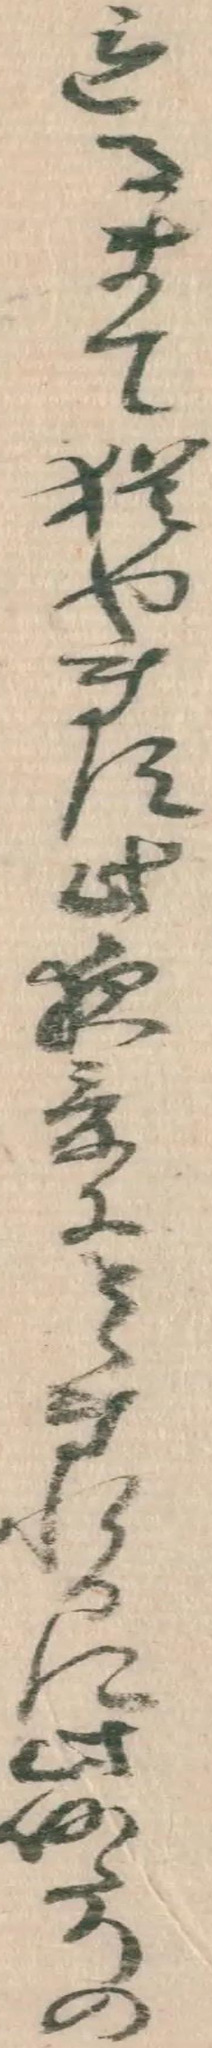れるまて猶やます此夜爰にとゝまれるに此あたりの
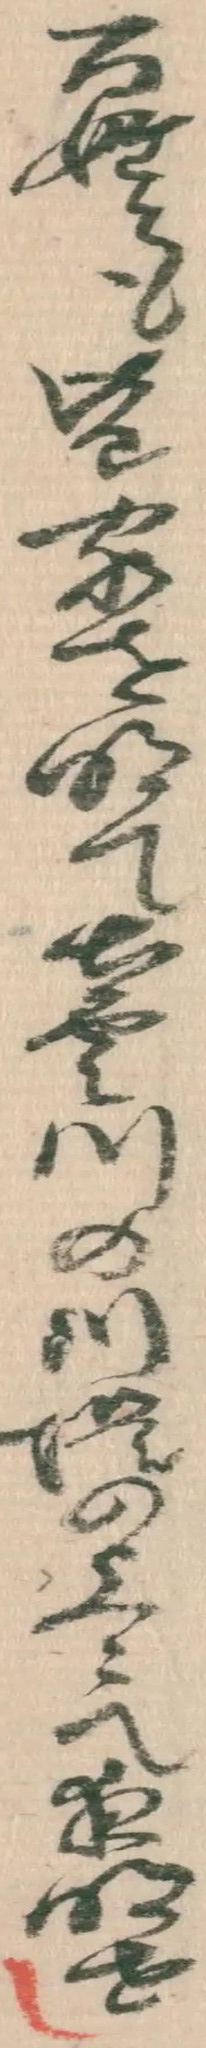百姓とも皆家を明て出雲川の川堤の上にて夜明せし
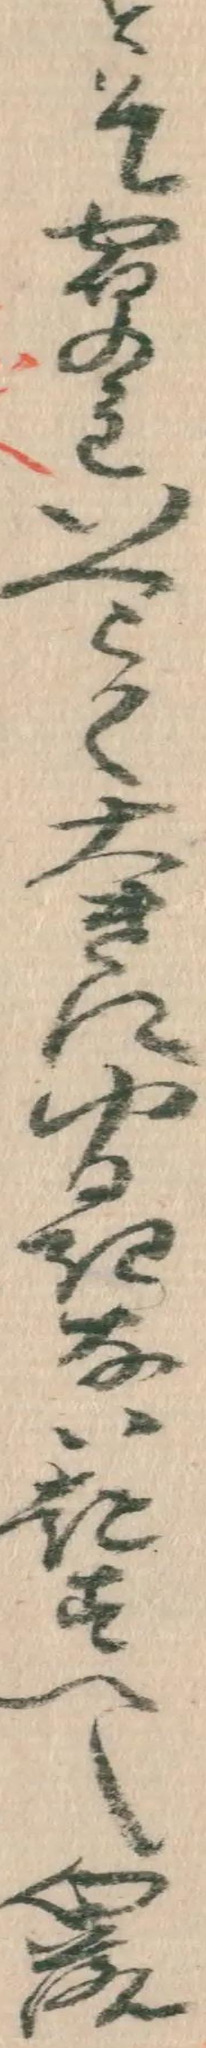とそ宿の主いへらく大きにゆるきなは起すへし心落
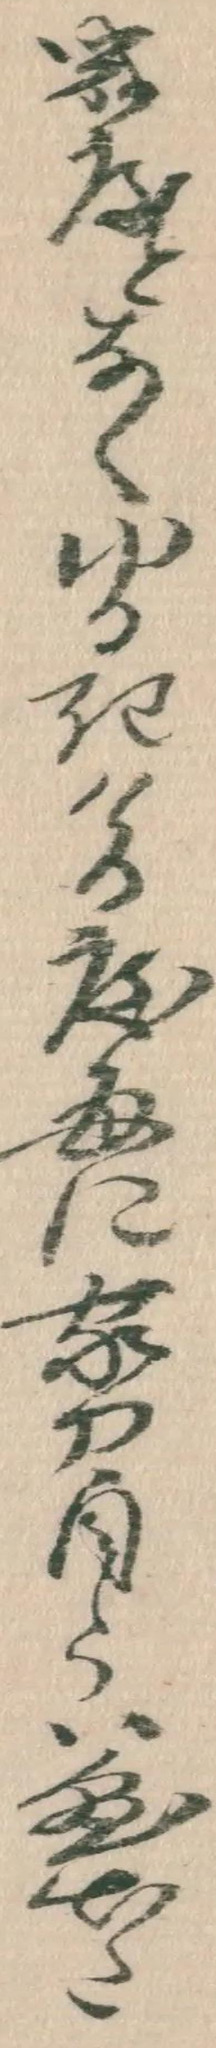幾度となくゆるきける度毎に家刀自らは懸出た
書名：出雲紀行. 20
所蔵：国立国会図書館 National Diet Library, JAPAN
